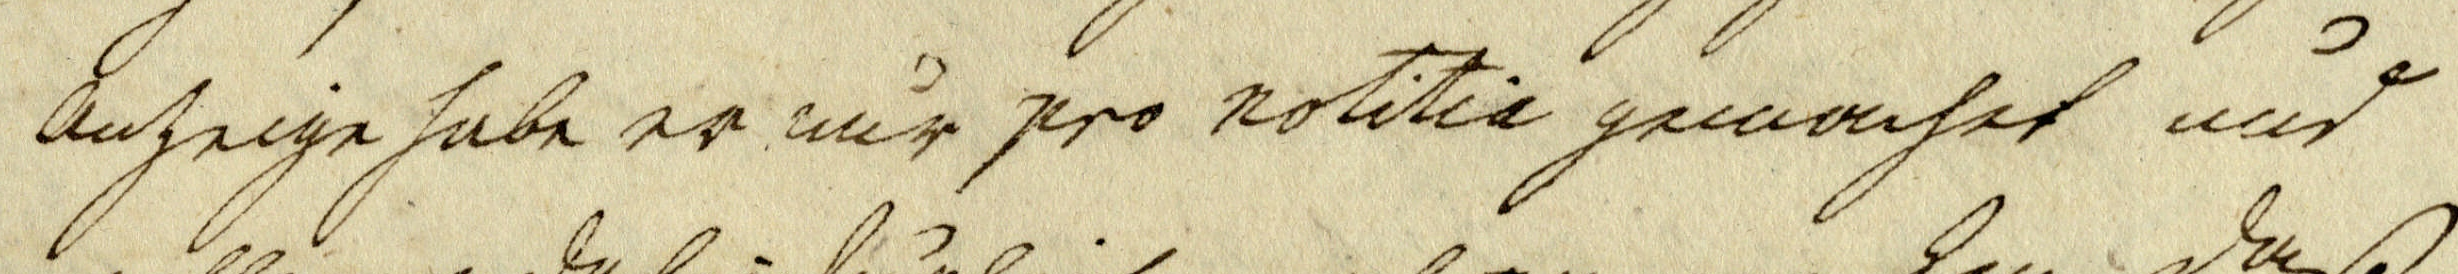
Anzeige habe er nur pro notitia gemachet und
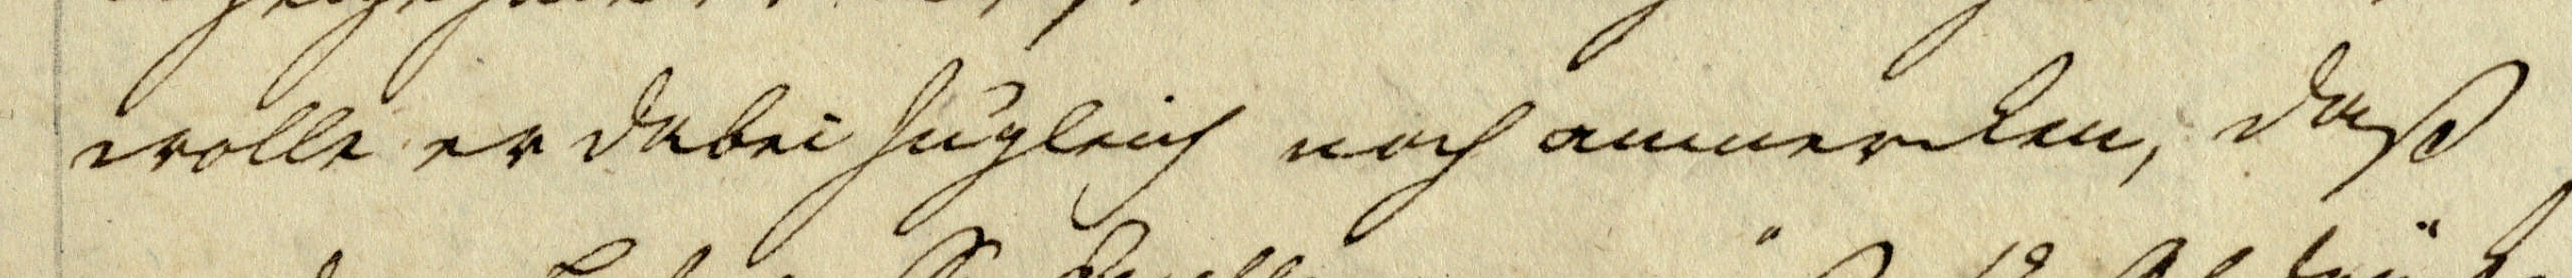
wolle er dabei zugleich noch anmercken, daß
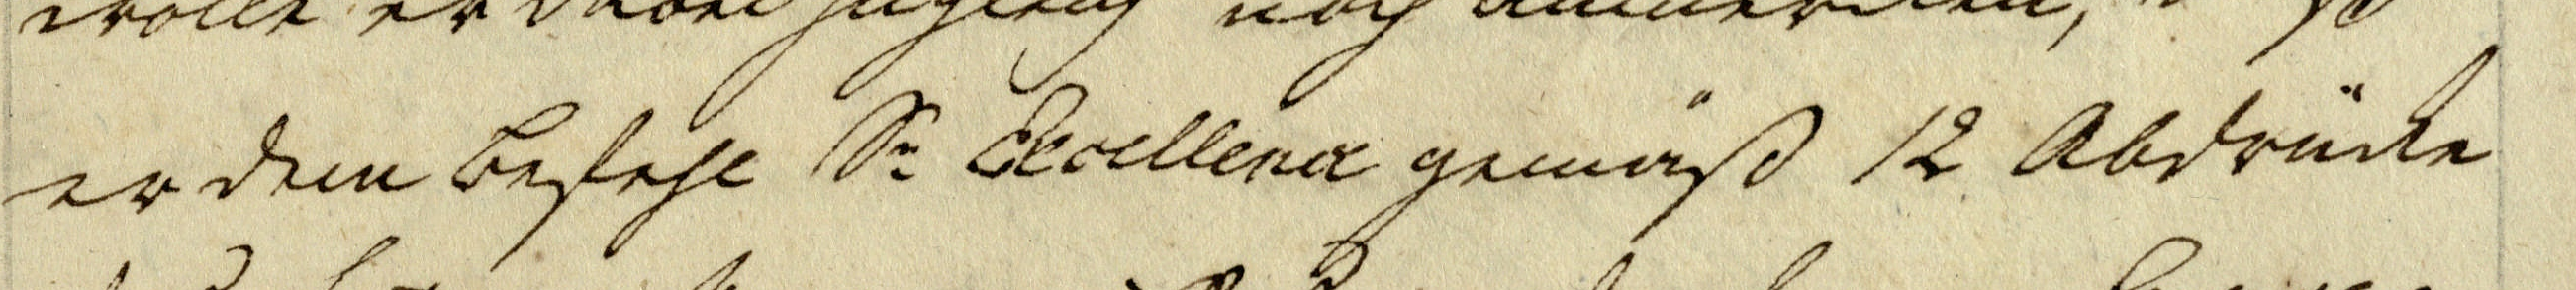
er dem Befehl Sr. Excellence gemäß 12 Abdrücke
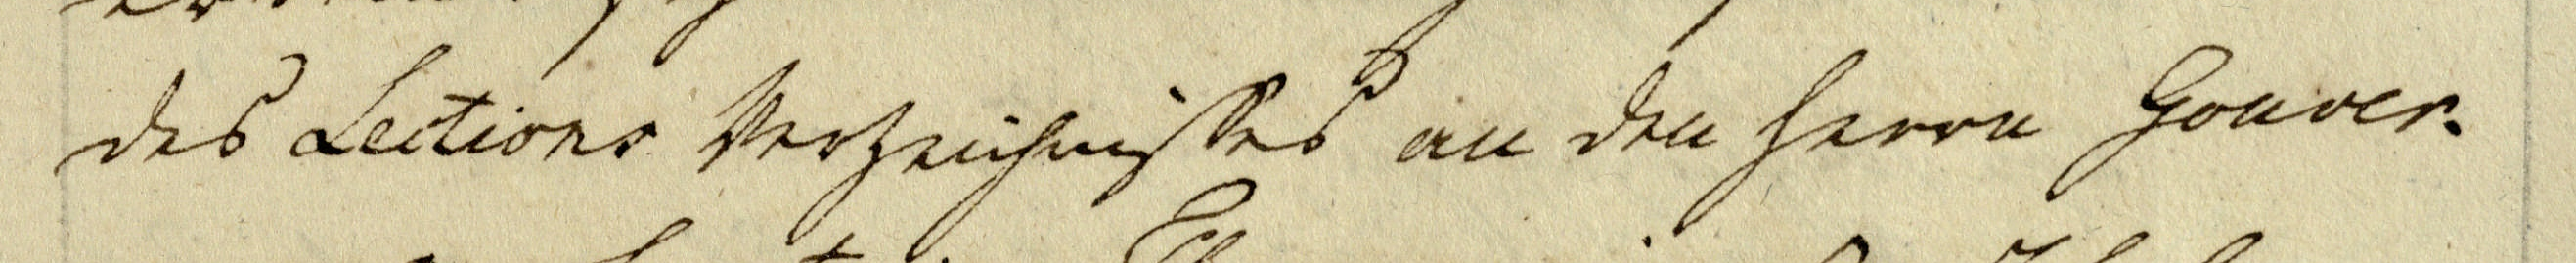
des Lections Verzeichnisses an den Herrn Gouver¬
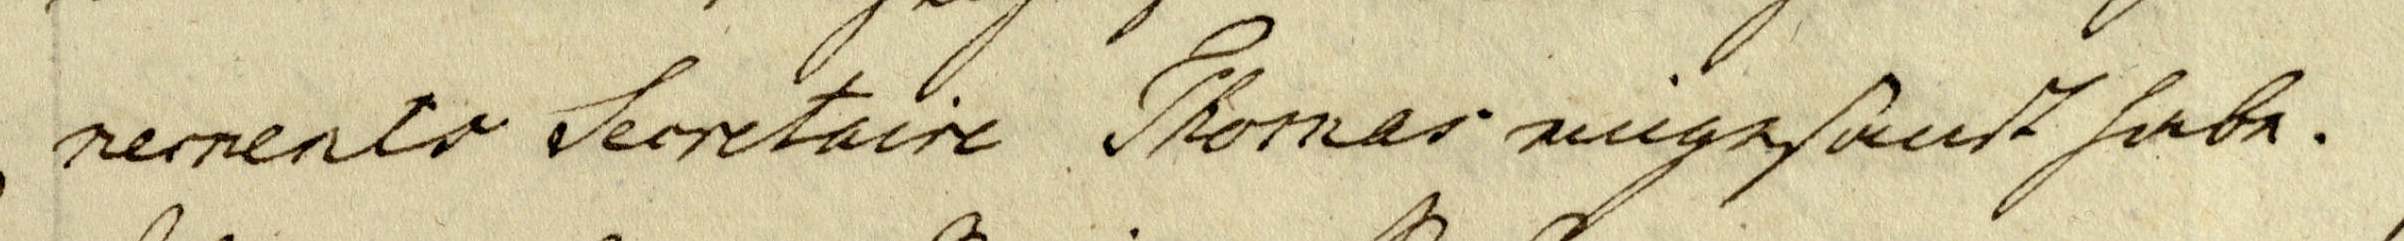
nements Secretaire Thomas eingesandt habe.
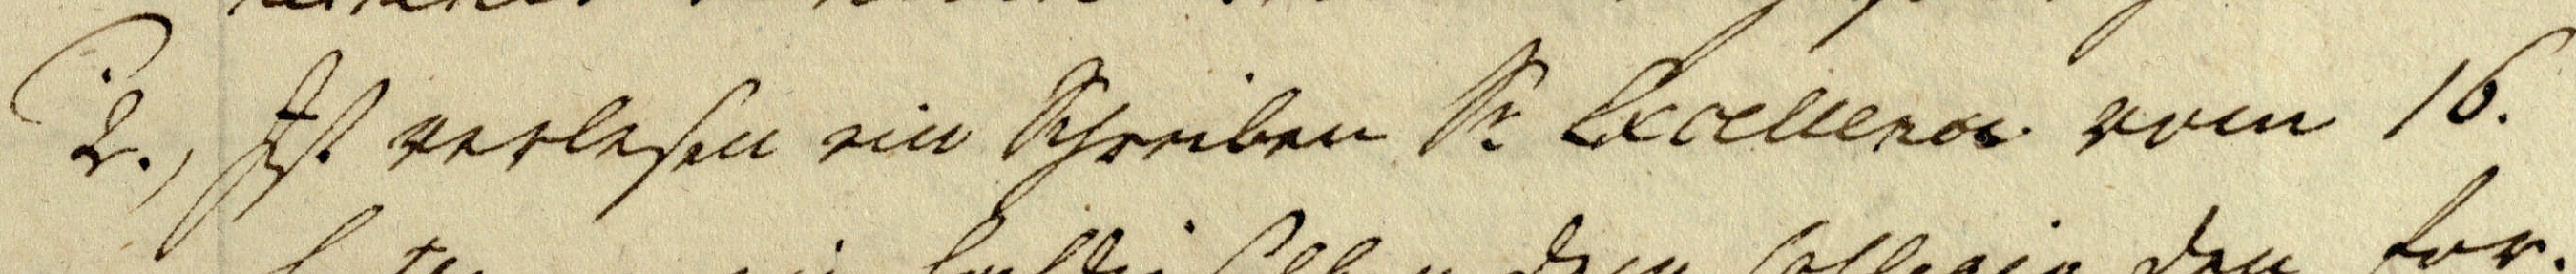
2., Ist verlesen ein Schreiben Sr Excellence vom 16.
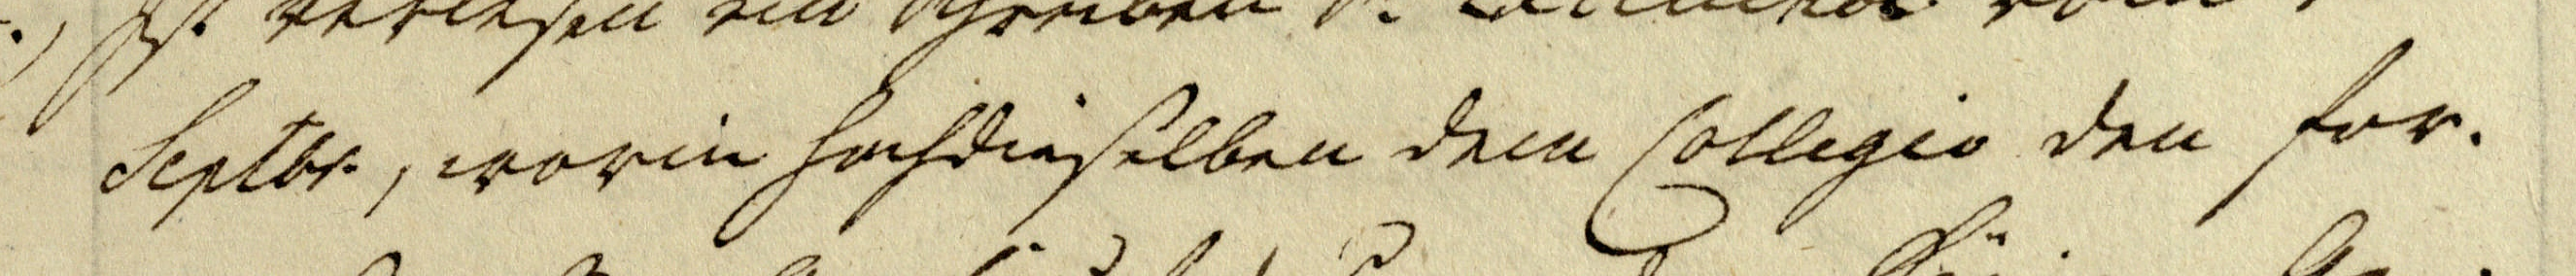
Septbr., worin hochdieselben dem Collegio den for¬
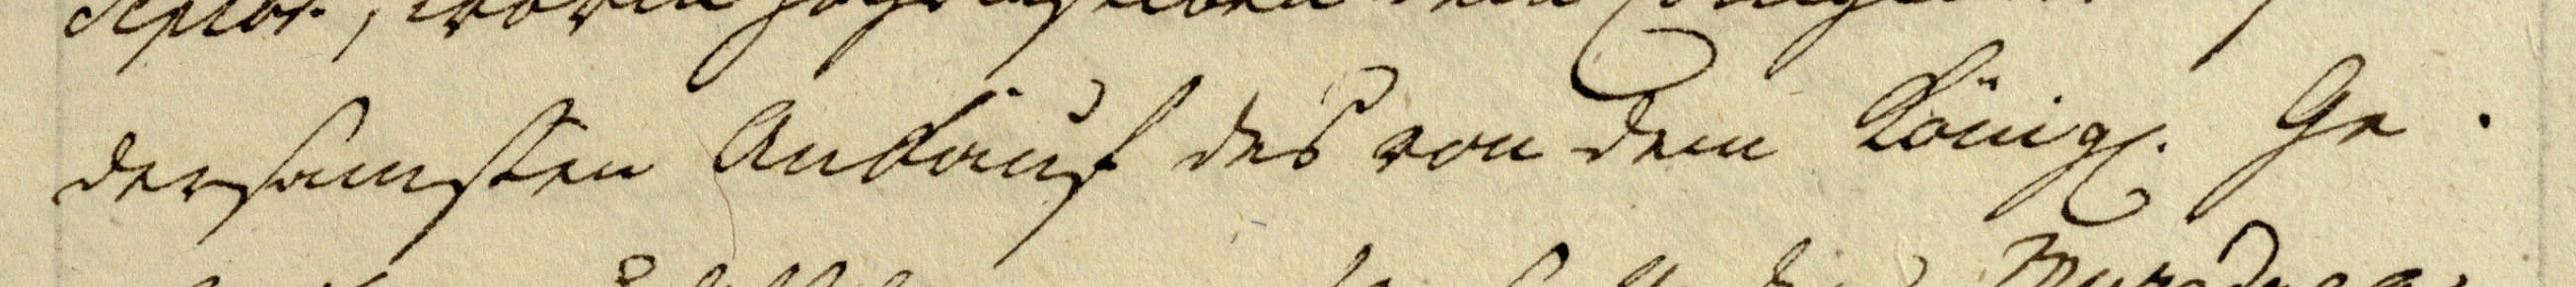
dersamsten Ankauf des von dem Königl. Ge¬
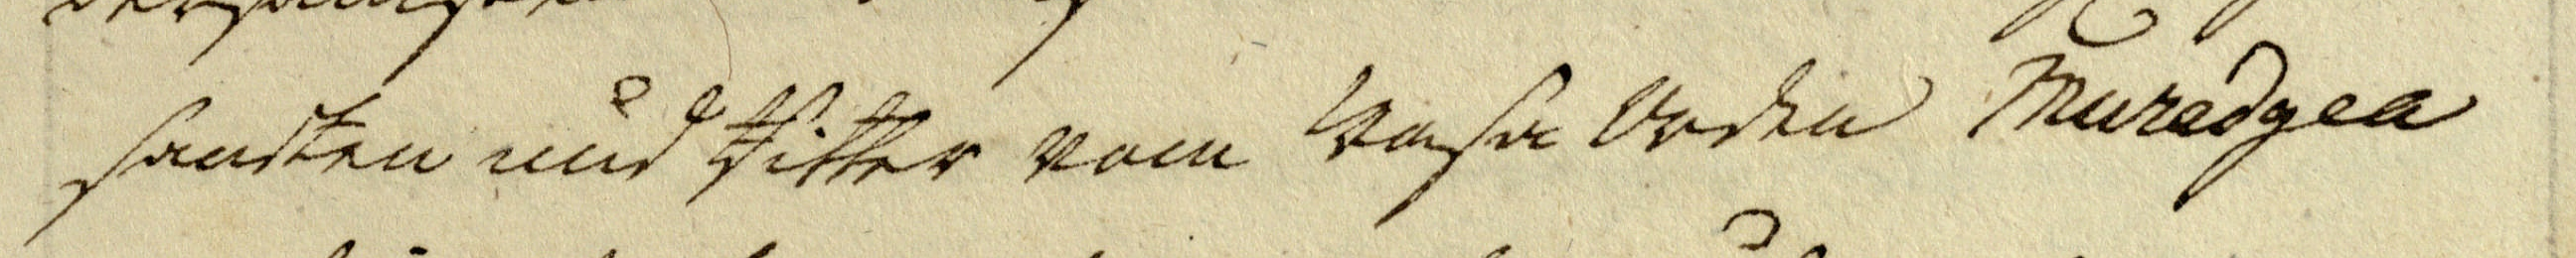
snndten und Ritter vom Wasa Orden Muradgea
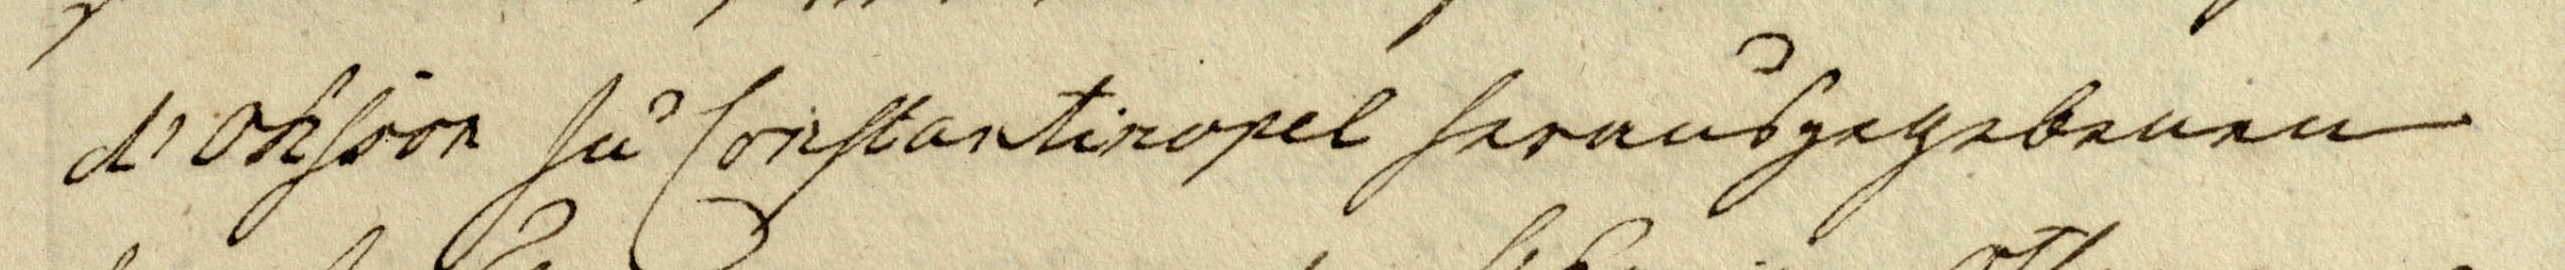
d Ohsson zu Constantinopel herausgegebenen
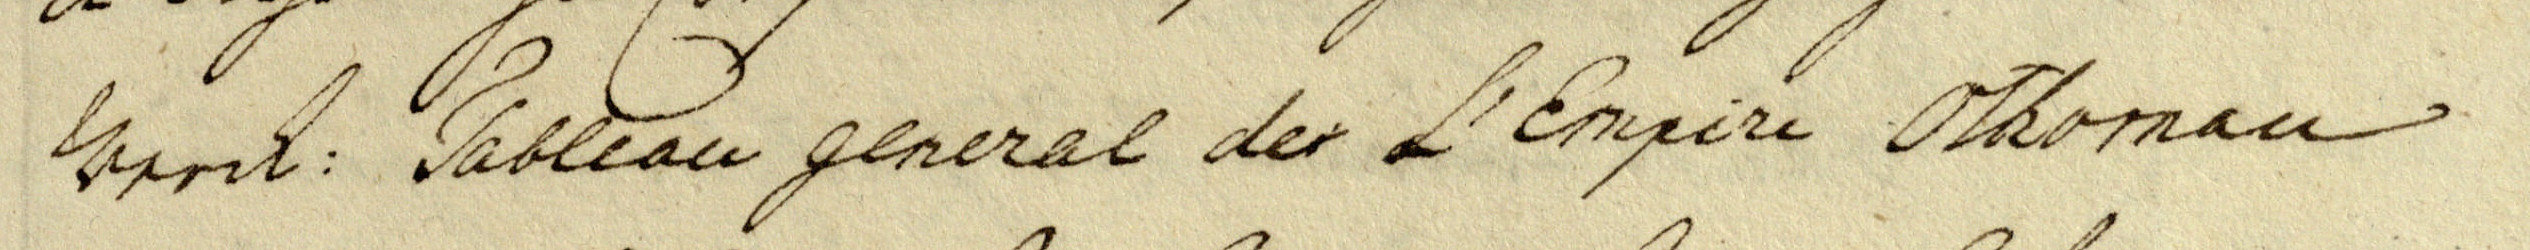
Werck: Tableau General der L Empire Othoman
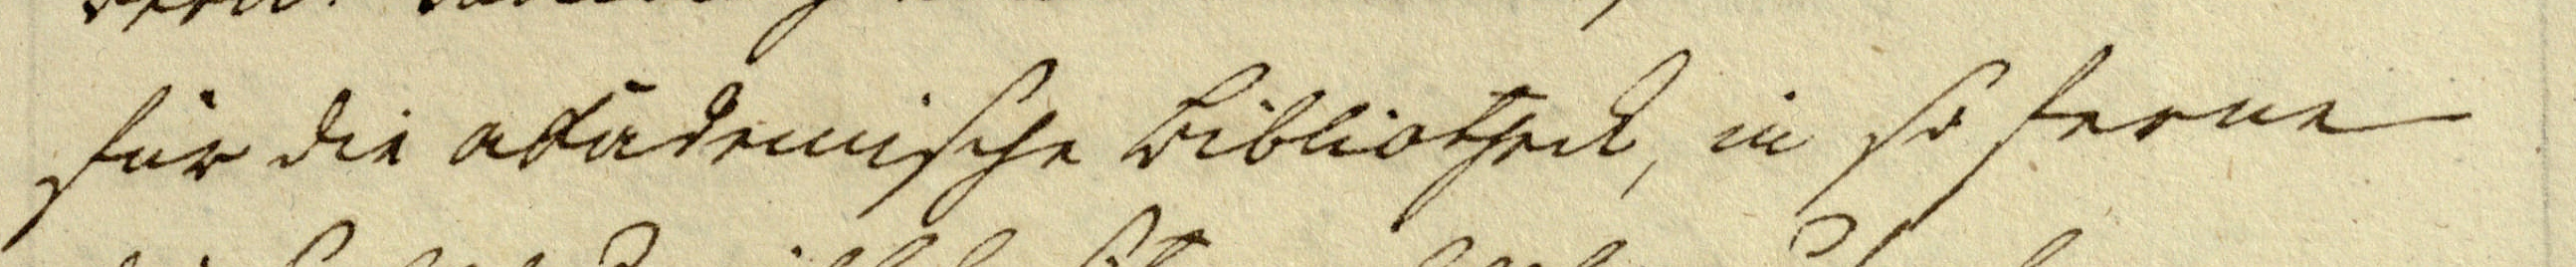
für die akademische Bibliotheck, in so ferne
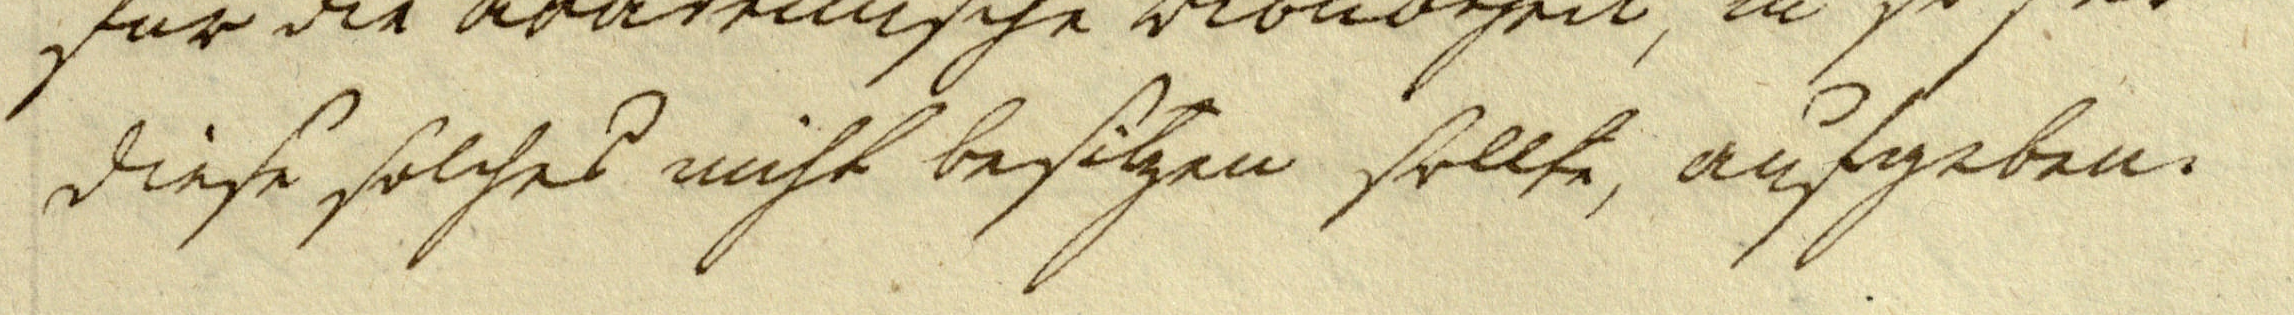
diese solches nicht besitzen sollte, aufgeben.
